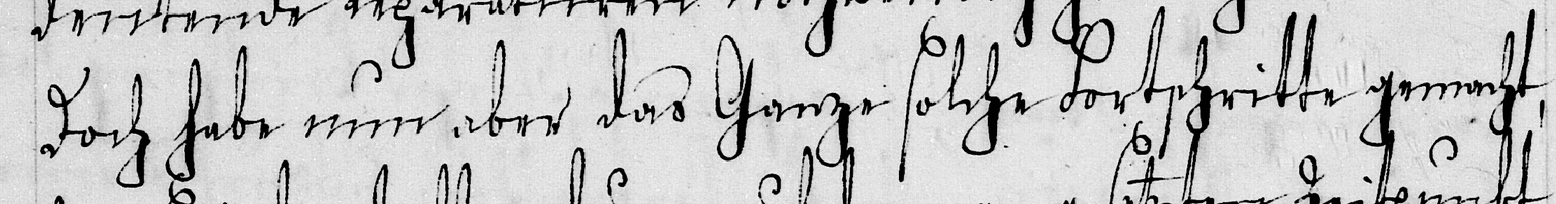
Doch habe nun aber das Ganze solche Fortschritte gemac¬
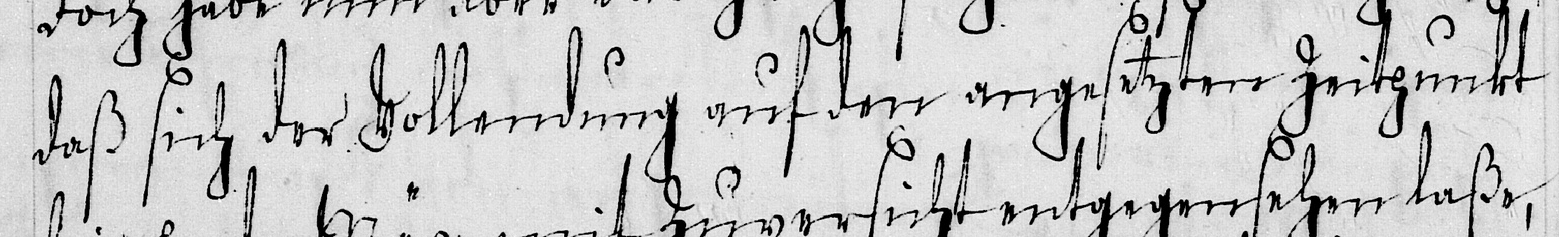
daß sich der Vollendung auf den angesetzten Zeitpunkt
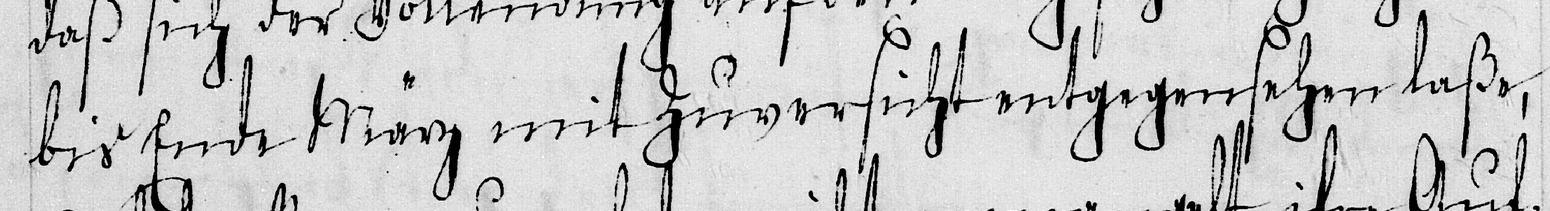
bis Ende März mit Zuversicht entgegensehen laße,
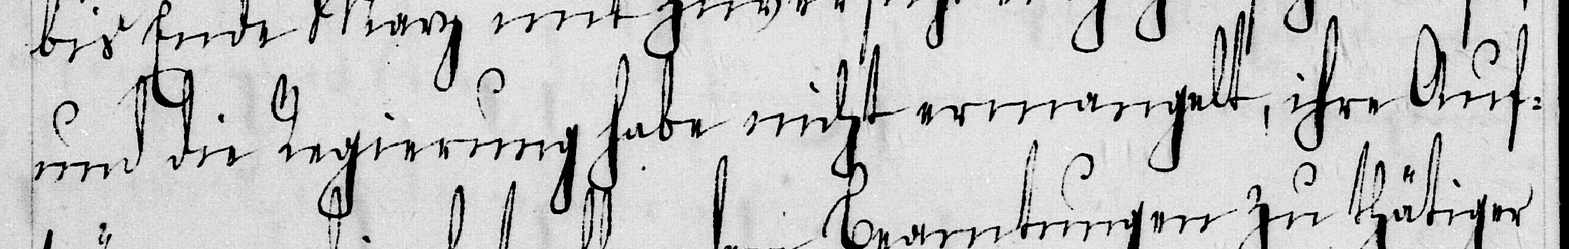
und die Regierung habe nicht ermangelt, ihre Auf¬
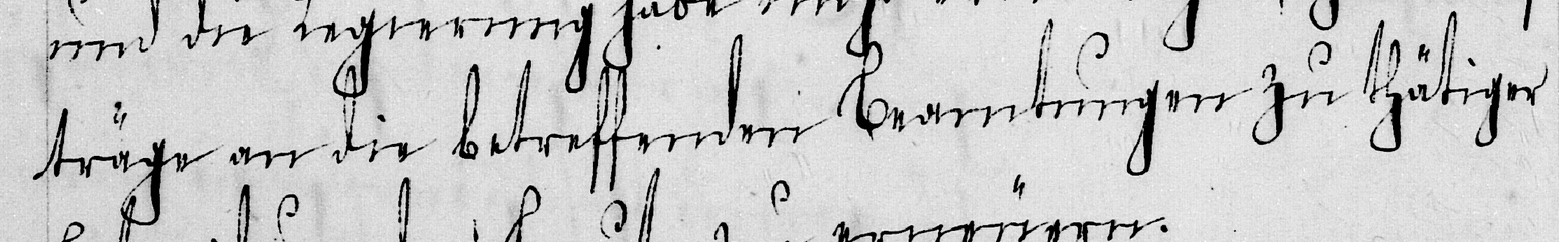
träge an die betreffenden Beamtungen zu thätiger
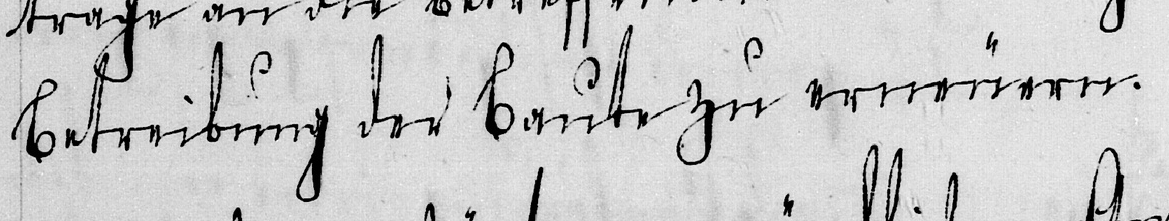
Betreibung der Baute zu erneuern.
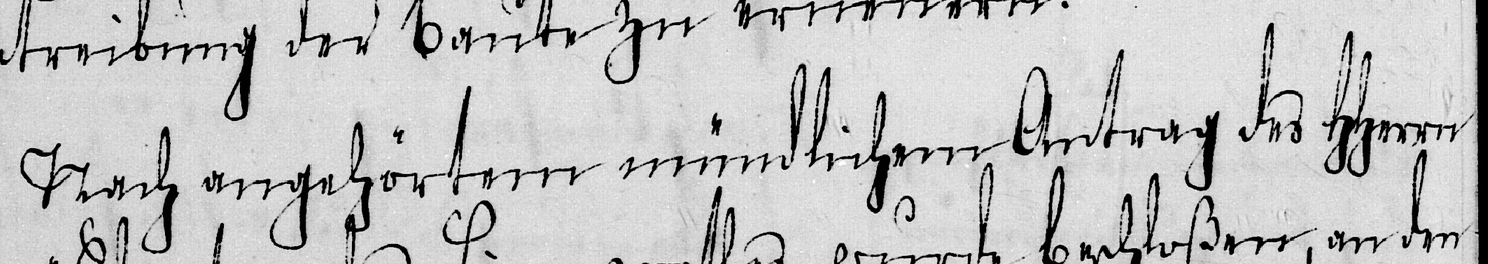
Nach angehörtem mündlichem Antrag des HHer¬
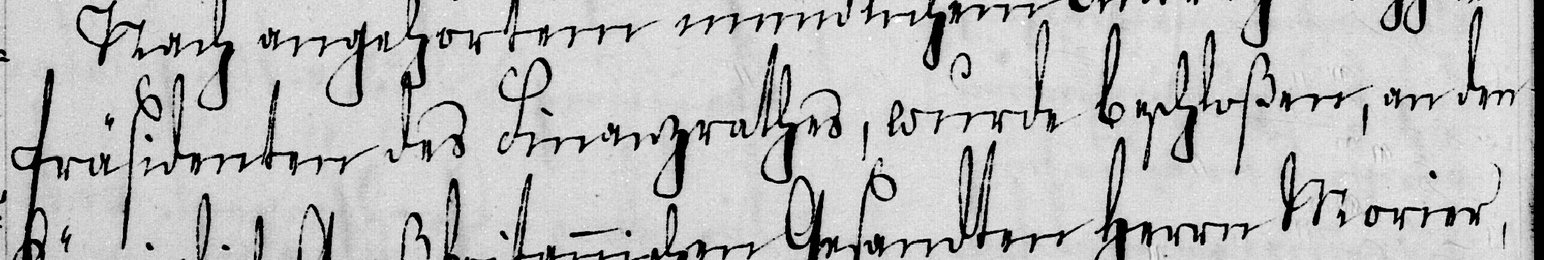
Präsidenten des Finanzrathes, wurde beschloßen, an den
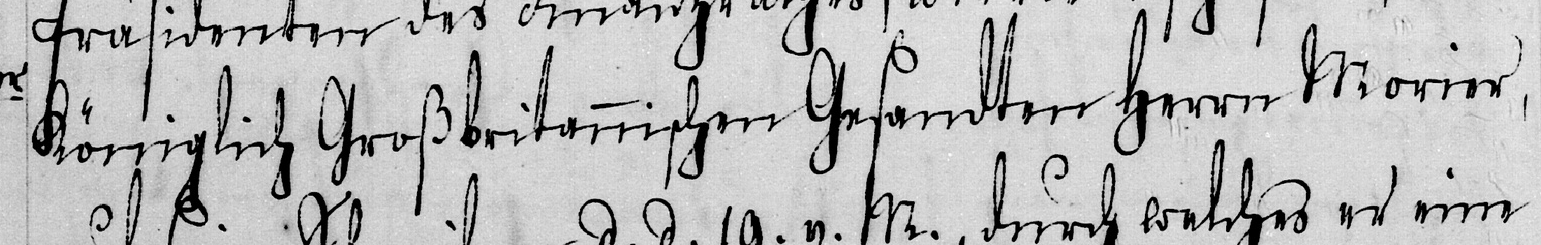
Königlich Großbritannischen Gesandten Herrn Morier
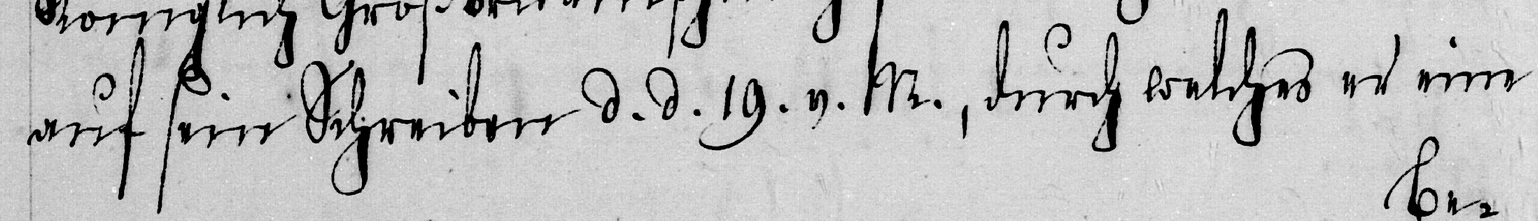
auf sein Schreiben d. d. 19. v. M., durch welches er eine
